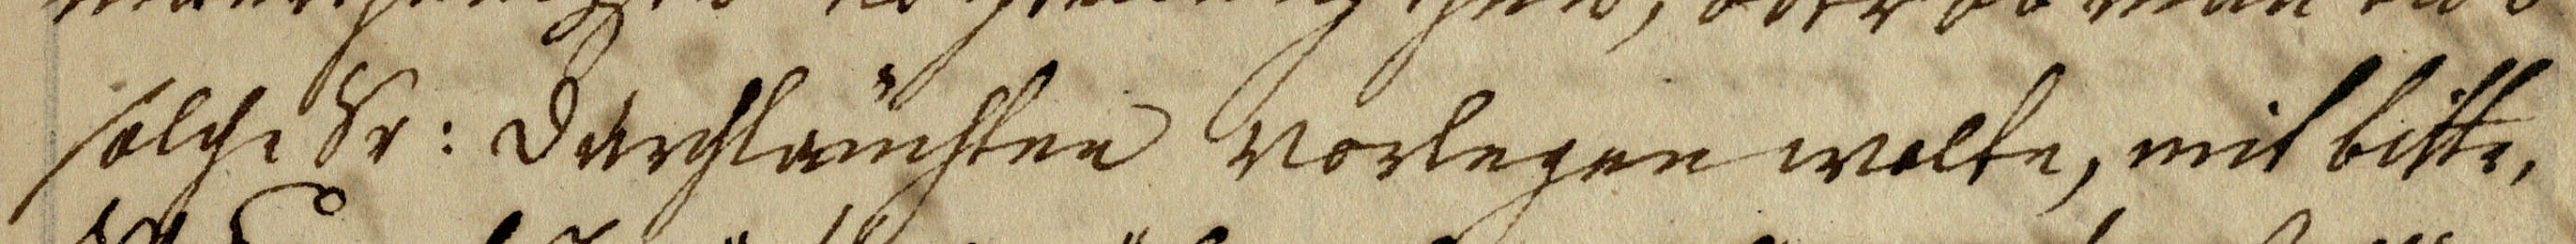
solche Sr. Durchlauchten vorlegen wolte, mit bitte,
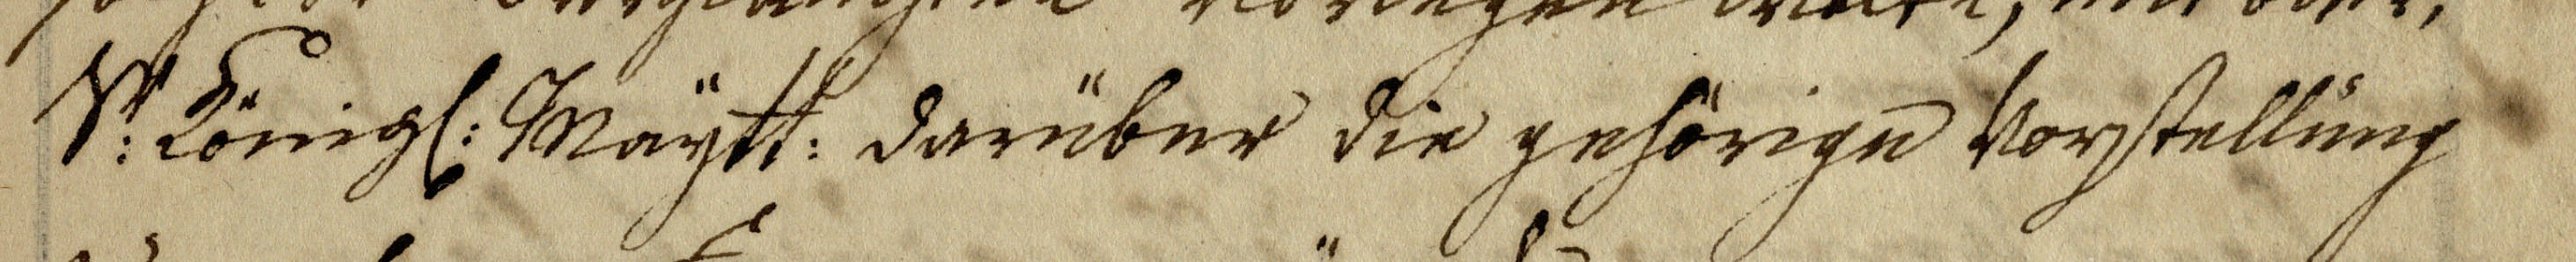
Sr. Königl. Maÿtt. darüber die gehörige Vorstellung
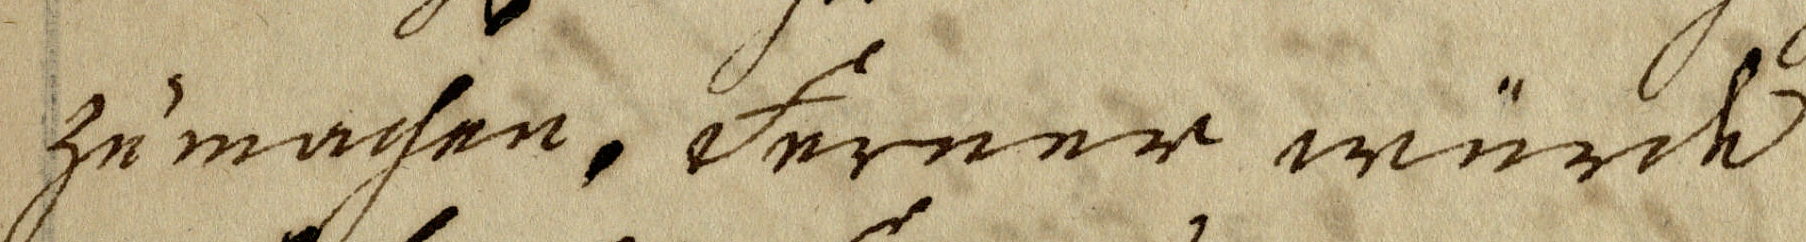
zu machen. Ferner würde
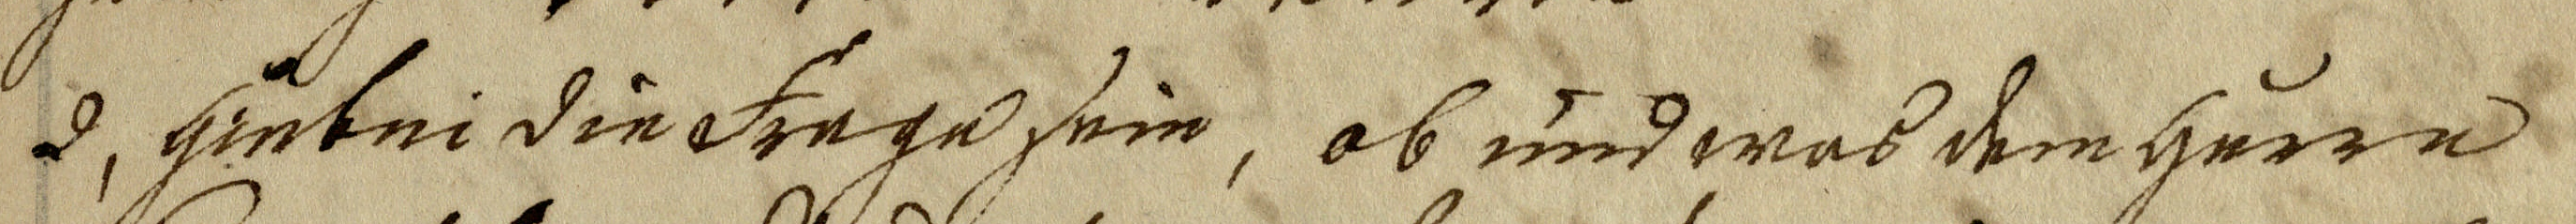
2, hiebei die Frage sein, ob und was dem Herrn
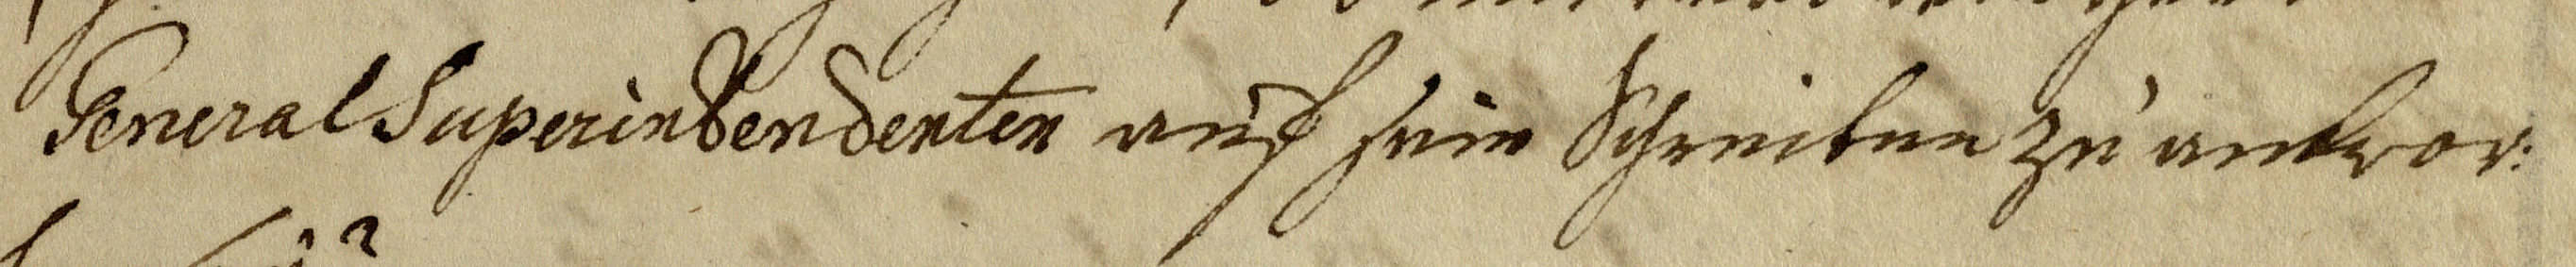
GeneralSuperintendenten auf sein Schreiben zu antwor¬
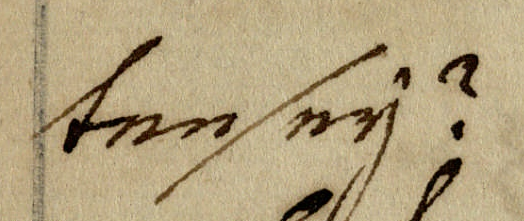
ten seÿ?
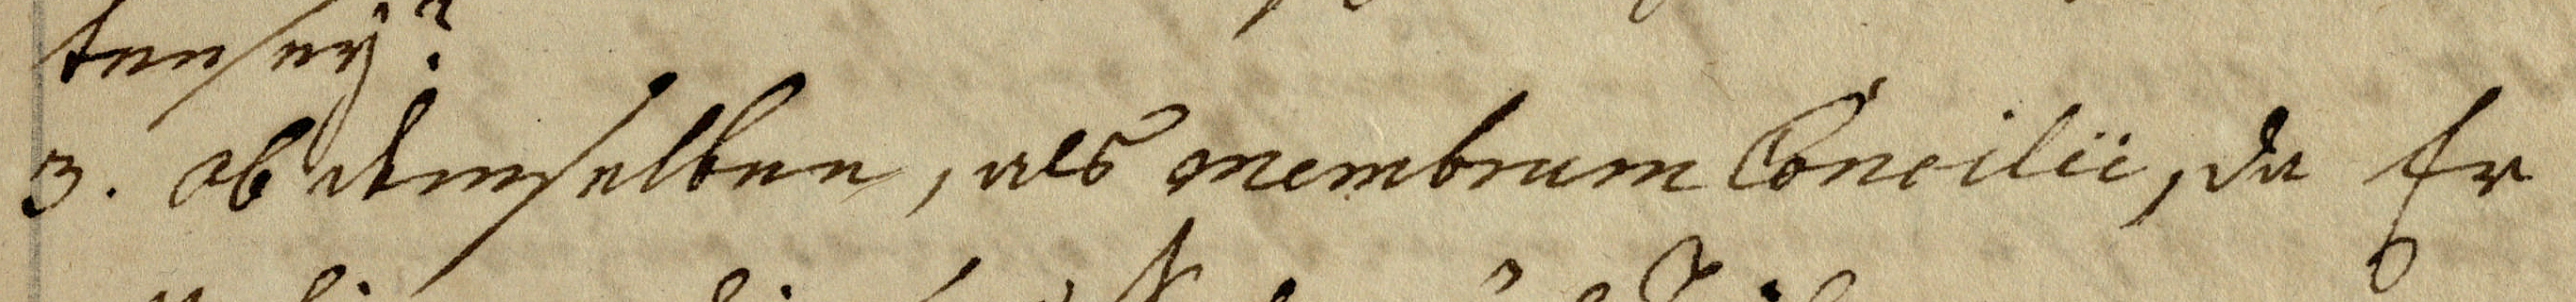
3. ob demselben, als membrum Concilii, da Er
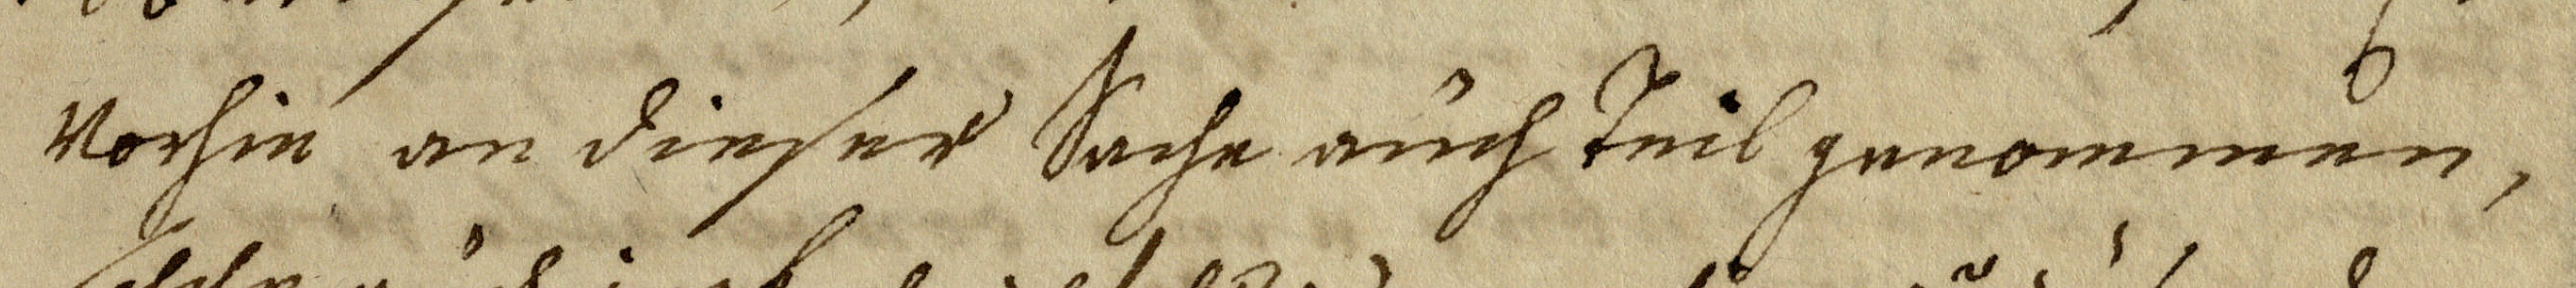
vorhin an dieser Sache auch Teil genommen,
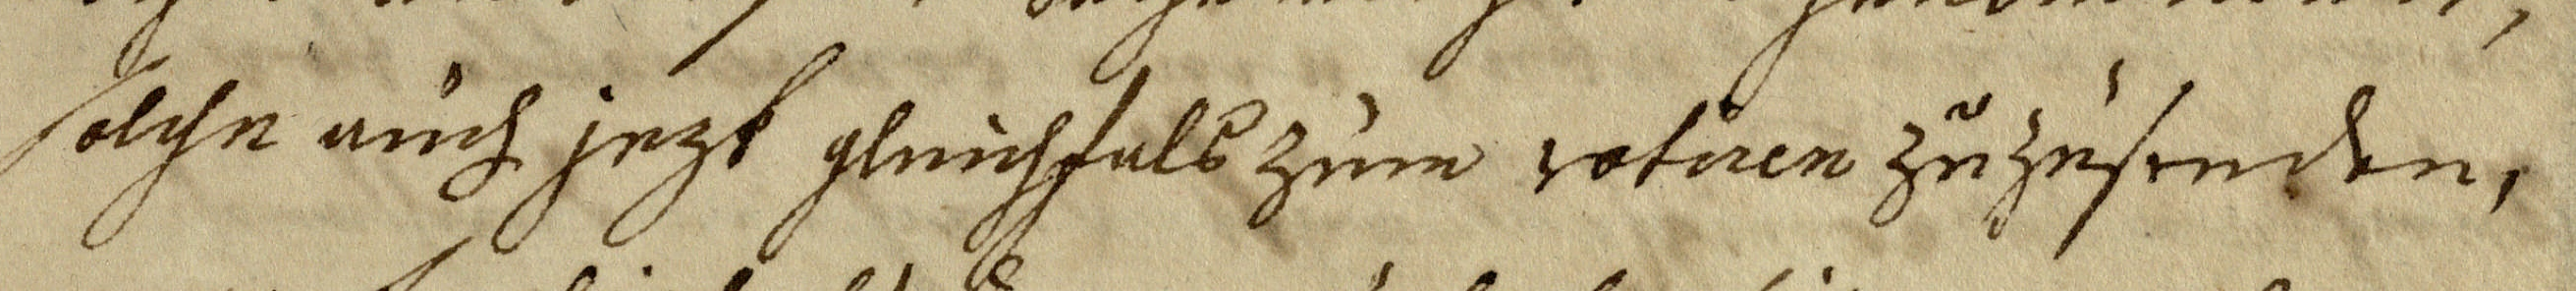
solche auch jetzt gleichfals zum votiren zu zusenden,
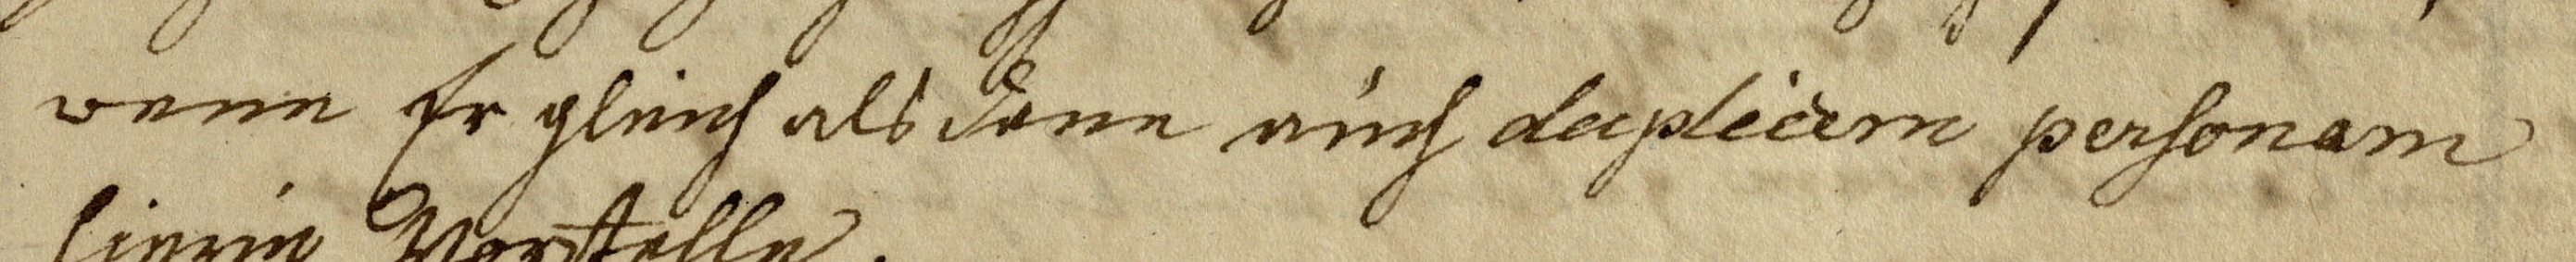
wenn Er gleich als dann auch duplicem personam
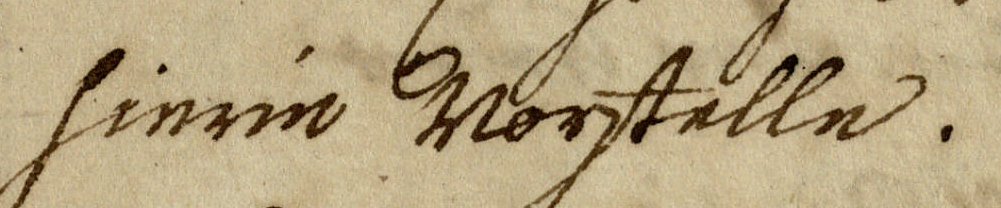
hierin vorstelle.
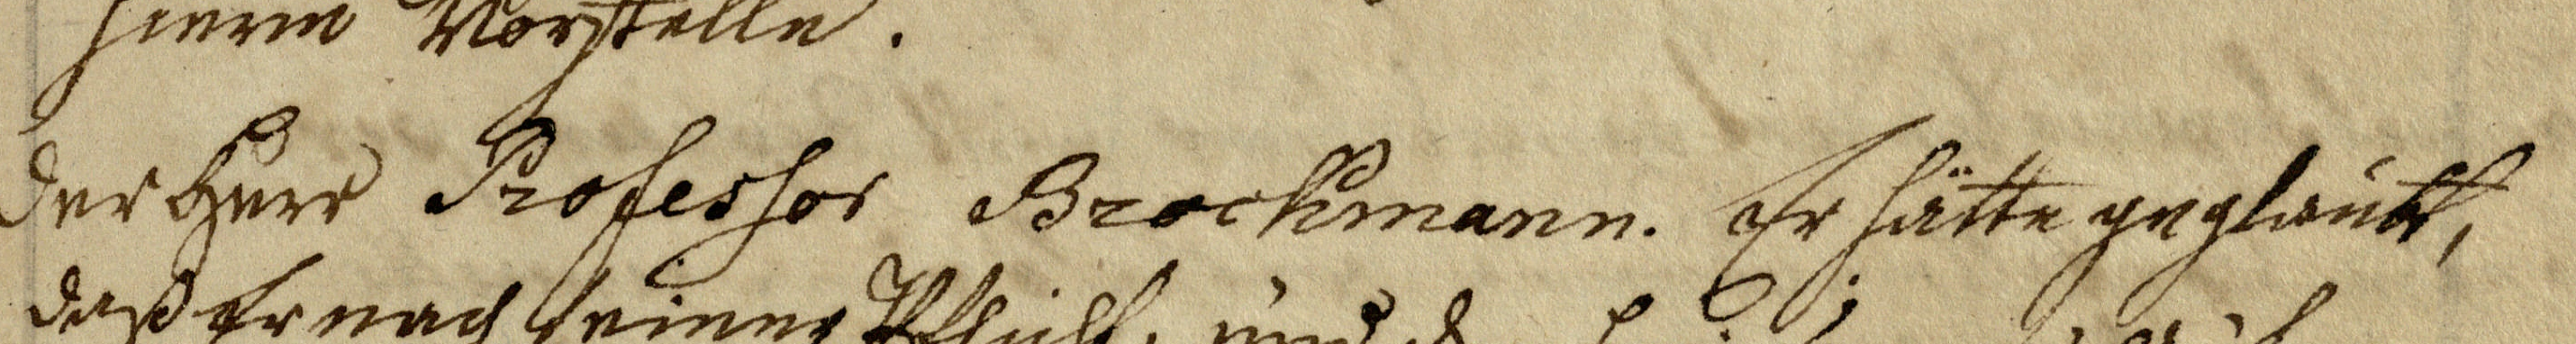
Der Herr Professor Brockmann Er hätte geglaubt,
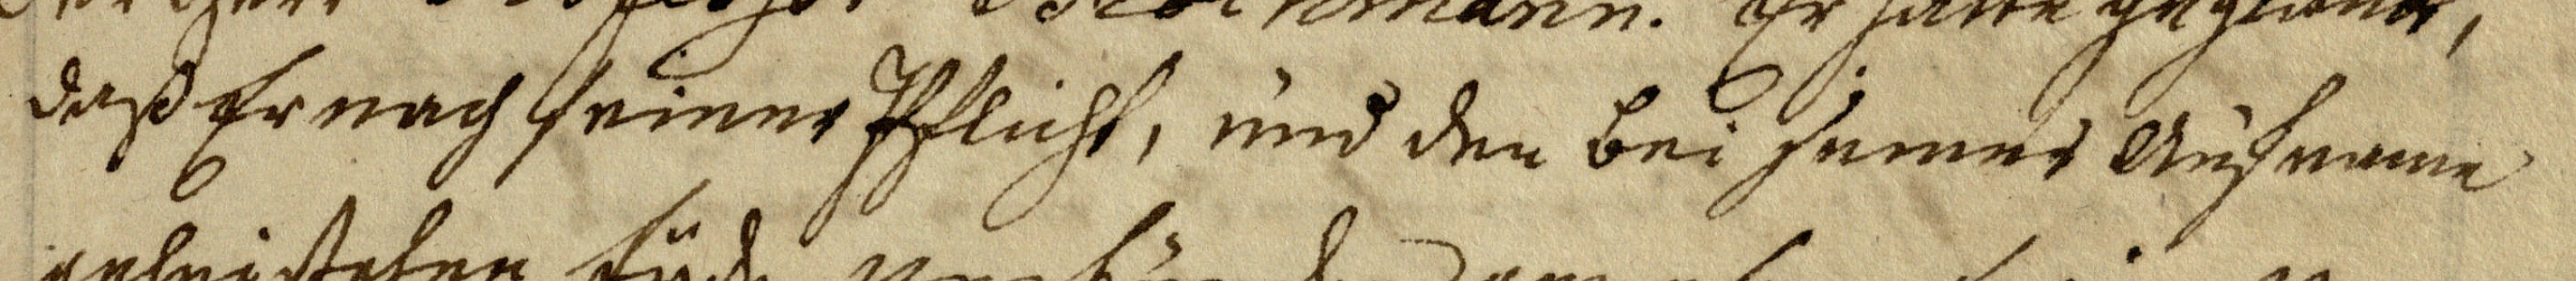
daß Er nach seiner Pflicht, und den bei seiner Aufname
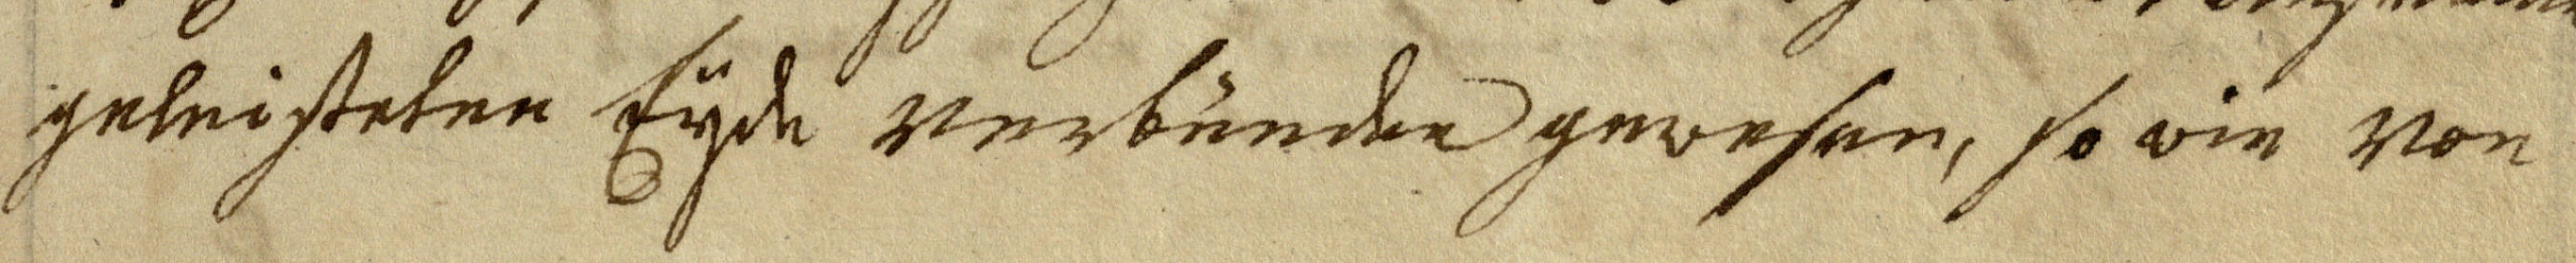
geleisteten Eÿde verbunden gewesen, so wie von
